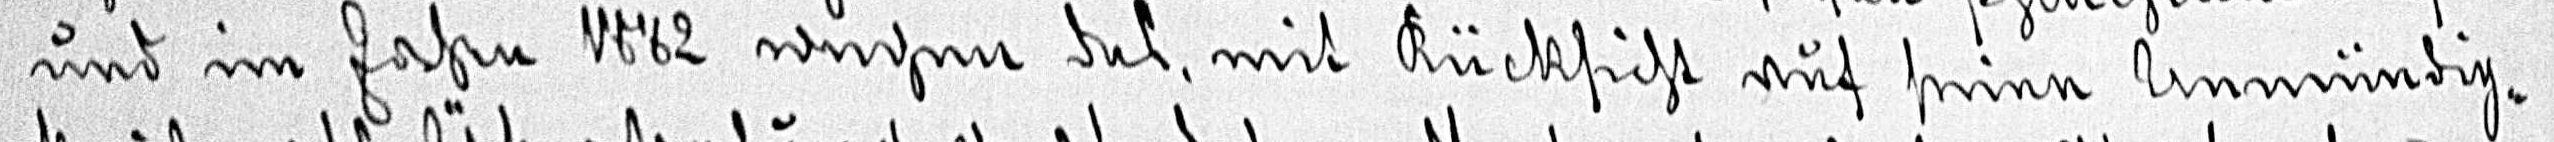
und im Jahre 1882 wegen des, mit Rücksicht auf seine Unmündig¬
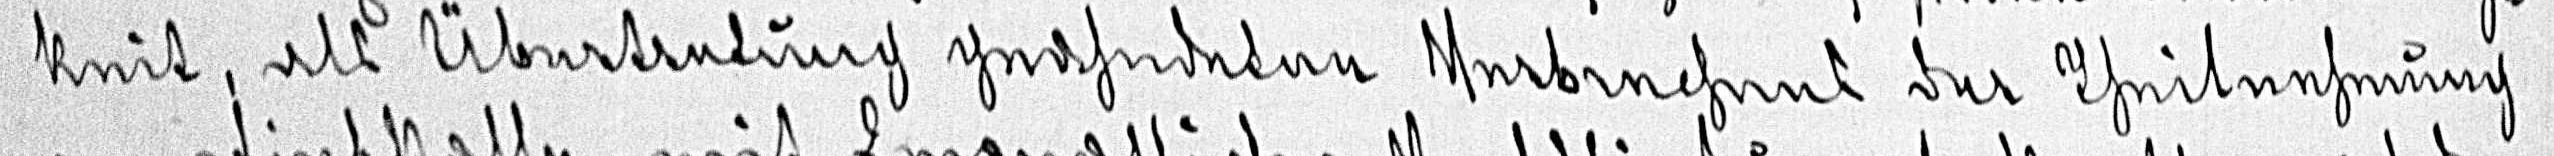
keit, als Übertretung geahndeten Verbrechens der Theilnehmung
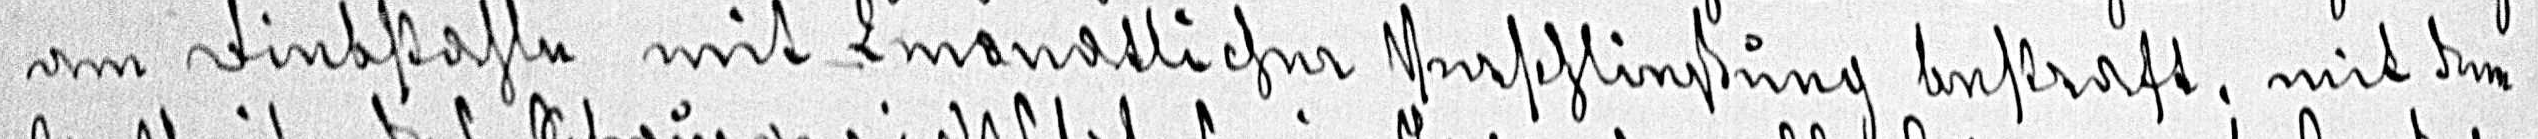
am Diebstahle mit 2monatlicher Verschließung bestraft, mit dem
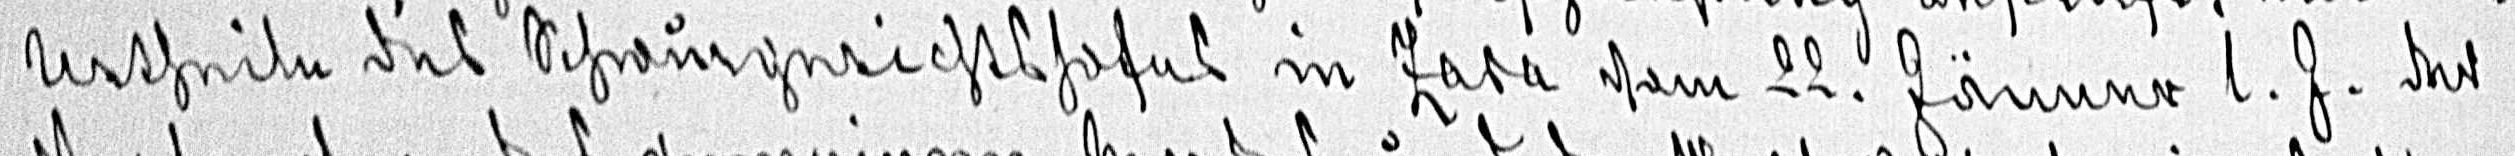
Urtheile des Schwurgerichtshofes in Zara vom 22. Jänner l. J. der
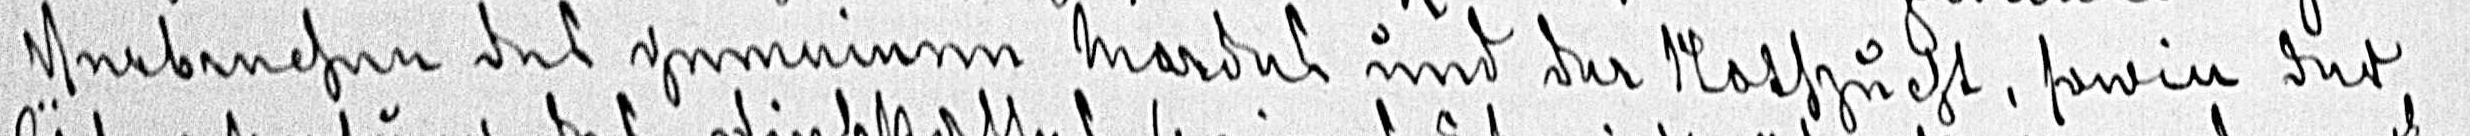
Verbrechen des Gemeinen Mordes und der Nothzucht, sowie der
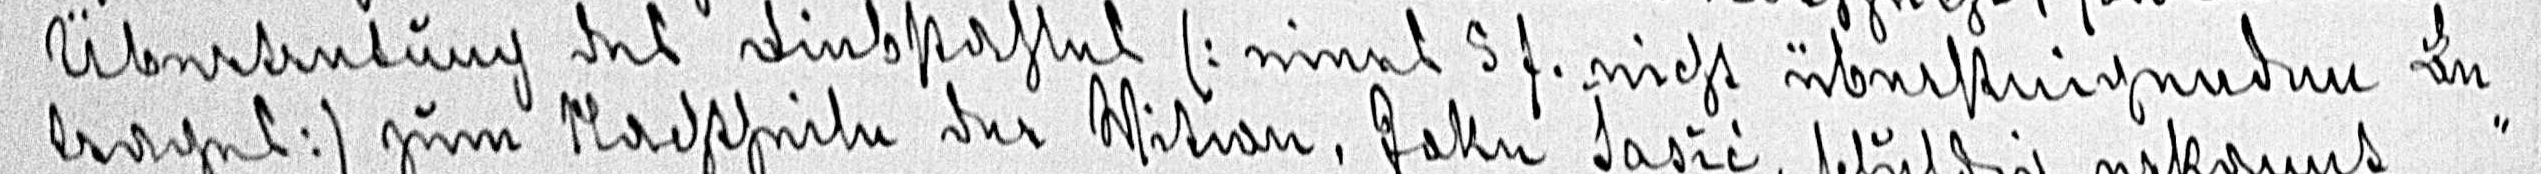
Übertretung des Diebstahles (eines 5f nicht übersteigenden Be¬
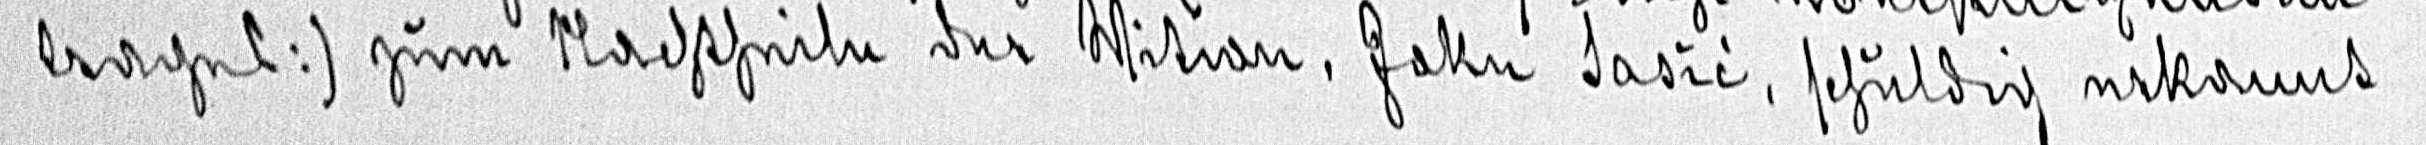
trages) zum Nachtheile der Witwe, Joke Šašić, schuldig erkannt
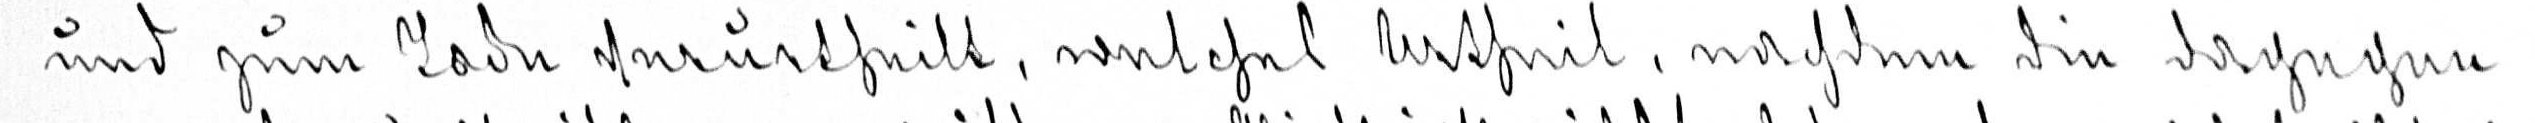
und zum Tode verurtheilt, welches Urtheil, nachdem die dagegen
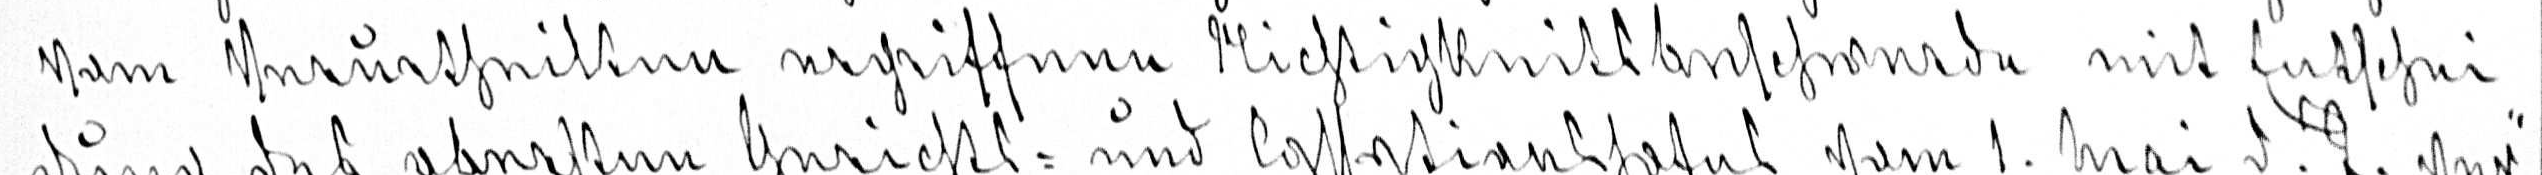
vom Verurtheilten ergriffene Nichtigkeitsbeschwerde mit Entschei¬
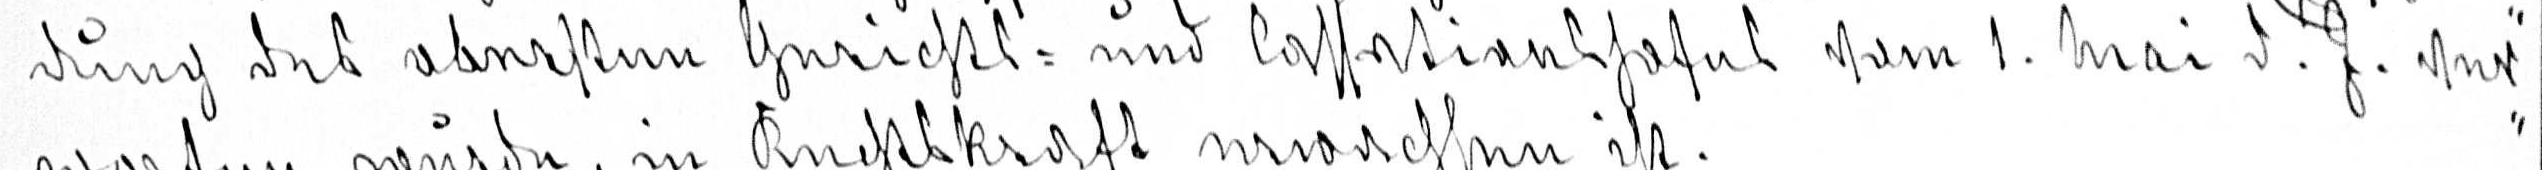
dung des obersten Gerichts- und Cassationshofes vom 1. Mai d. J. ver¬
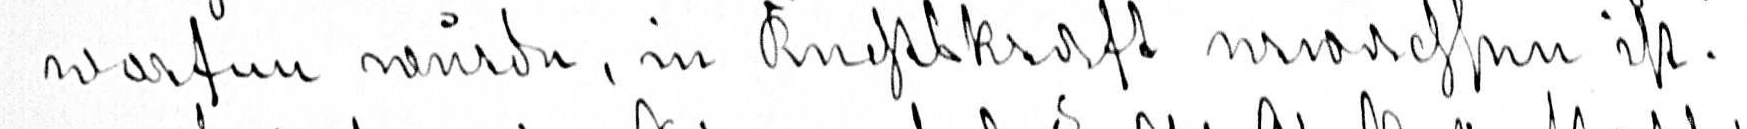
worfen wurde, in Rechtskraft erwachsen ist.
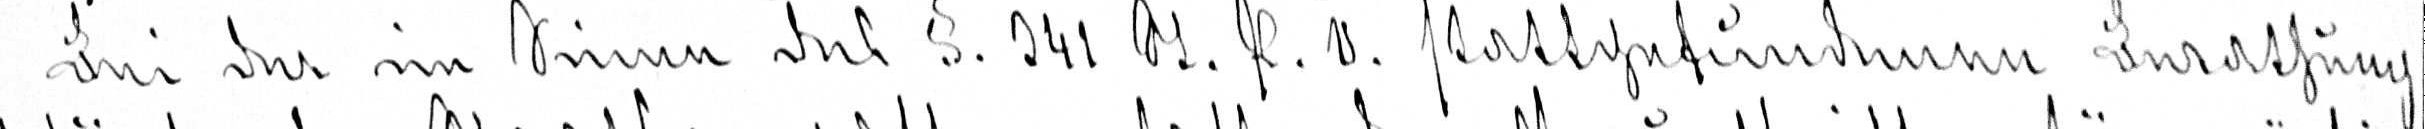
Bei der im Sinne des §341 St. P. V. stattgefundenen Berathung
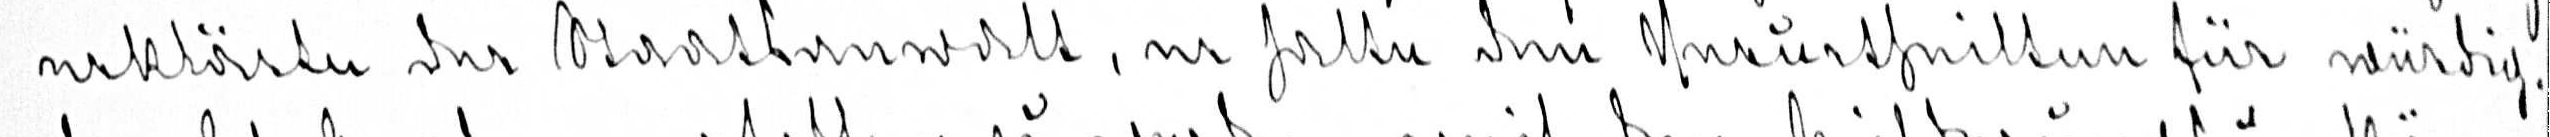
erklärte der Staatsanwalt, er hatte den Verurtheilten für würdig,
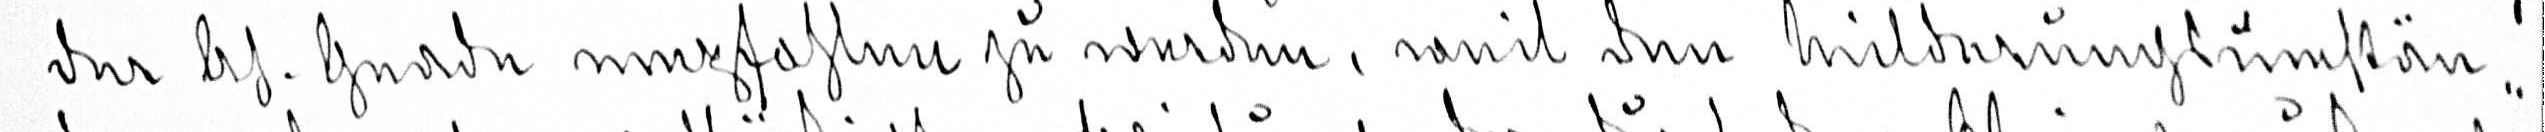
der Ah. Gnade empfehlen zu werden, weil den Milderungsumstän¬
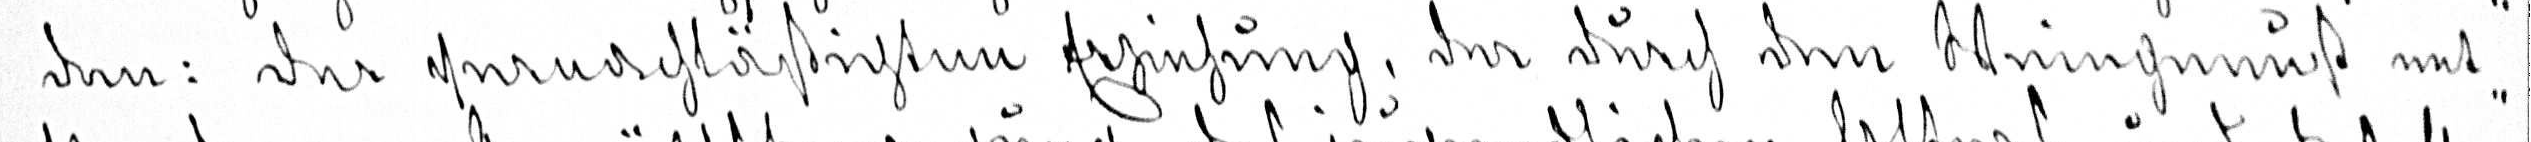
den: der vernachläßigten Erziehung, der durch den Weingenuß ent¬
